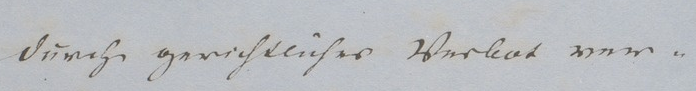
durch gerichtliches Verbot ver-
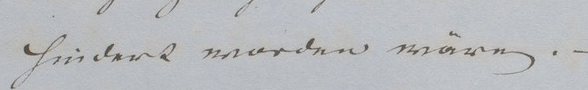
hindert worden wäre. –
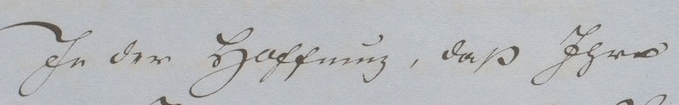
In der Hoffnung, daß Ihre
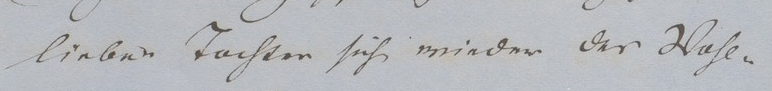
liebe Tochter sich wieder des Wohl-
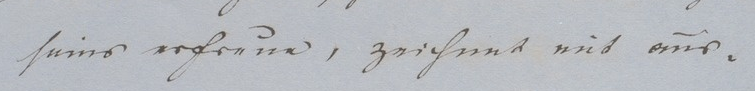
seins erfreue, zeichnet mit aus-
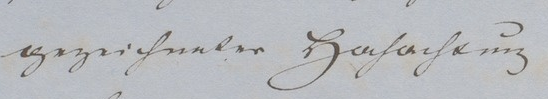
gezeichneter Hochachtung
